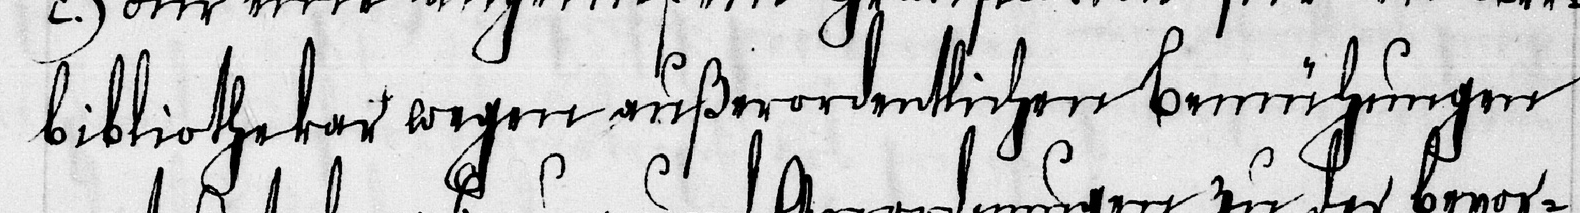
bibliothekar wegen außerordentlichen Bemühungen
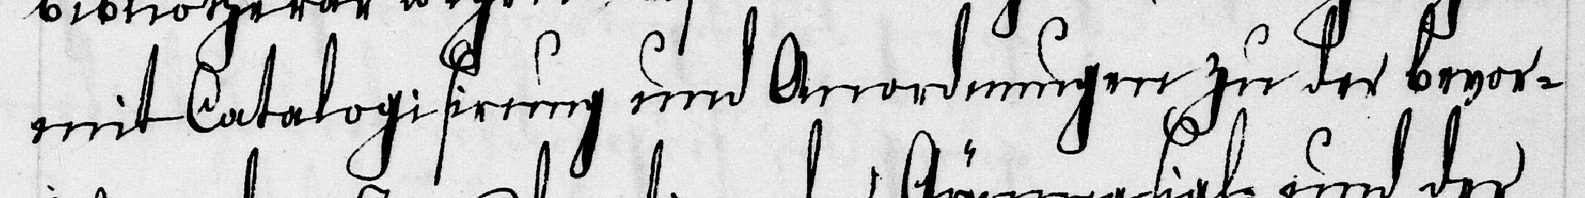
mit Catalogisirung und Anordnungen zu der bevor¬
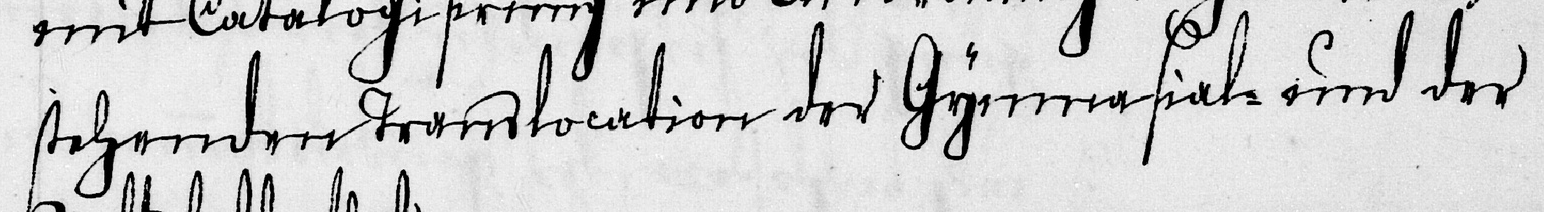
stehenden Translocation der Gymnasial- und der
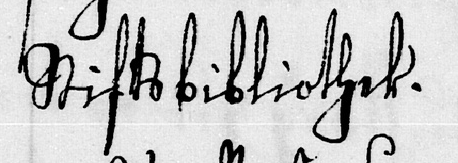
Stiftsbibliothek.
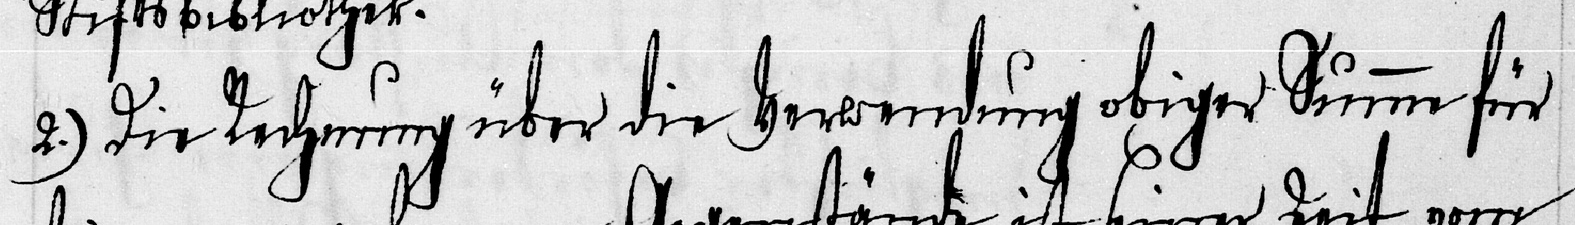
2.) Die Rechnung über die Verwendung obiger Summe für
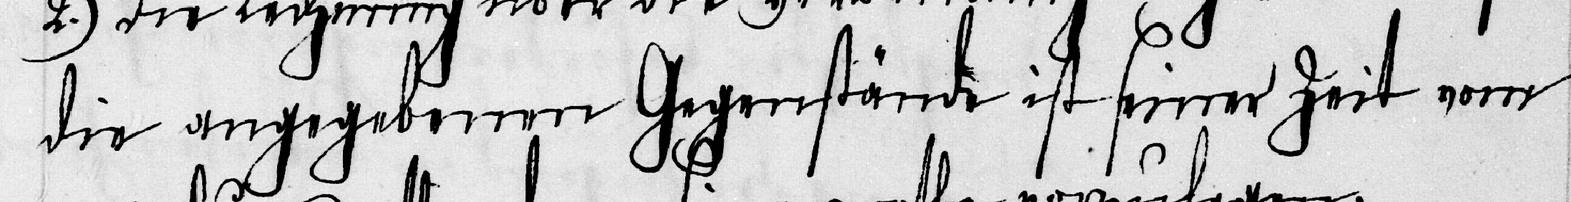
die angegebenen Gegenstände ist seiner Zeit vom
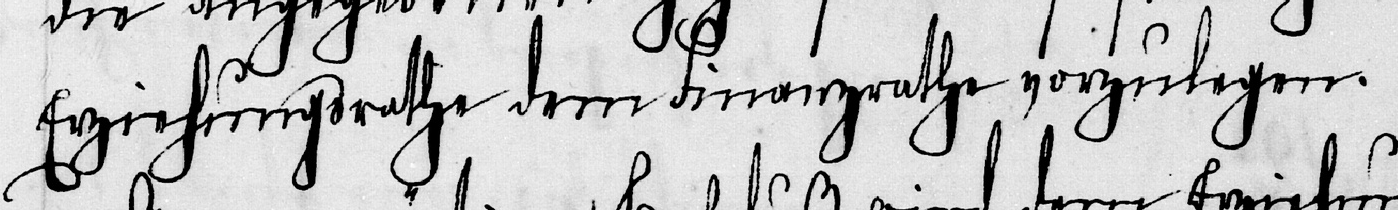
Erziehungsrathe dem Finanzrathe vorzulegen.
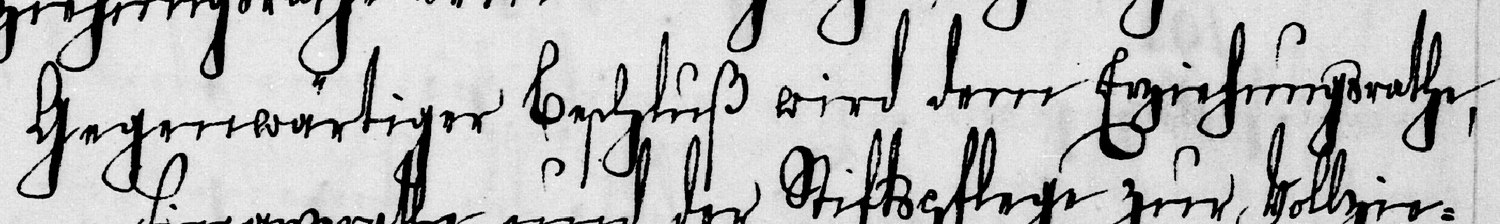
Gegenwärtiger Beschluß wird dem Erziehungsrathe,
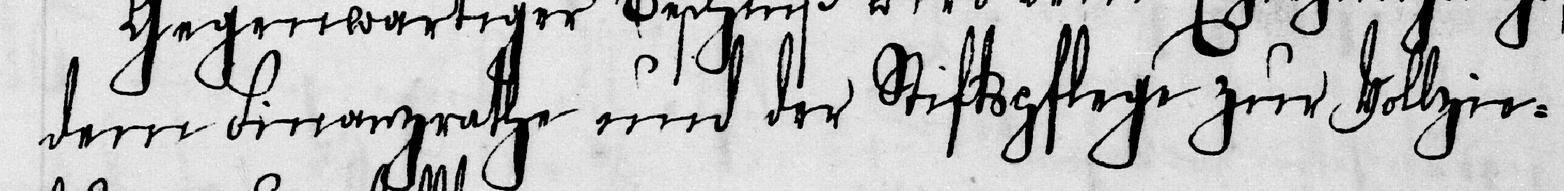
dem Finanzrathe und der Stiftspflege zur Vollzie¬
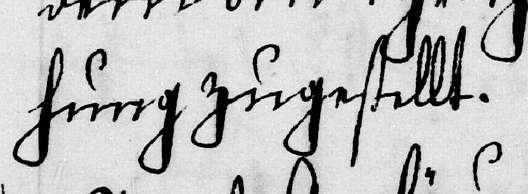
hung zugestellt.
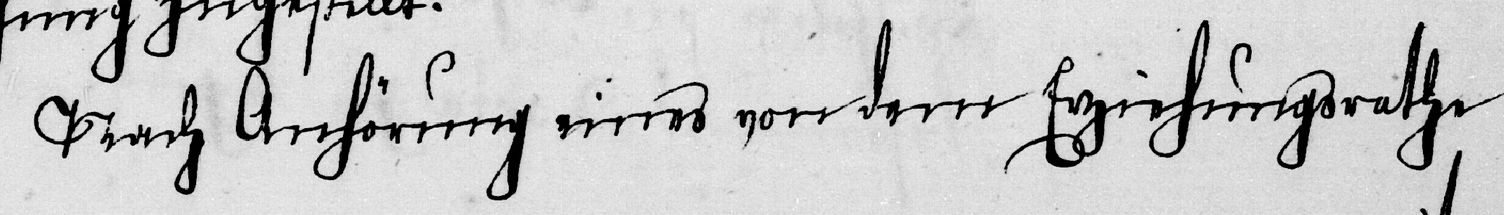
Nach Anhörung eines von dem Erziehungsrathe
